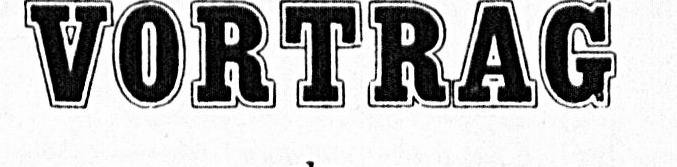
VORTRAG
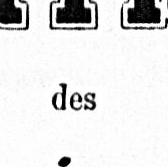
des
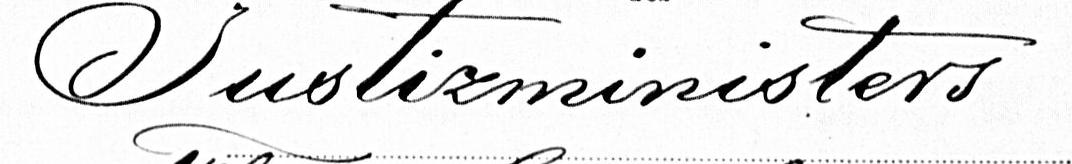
Justizministers
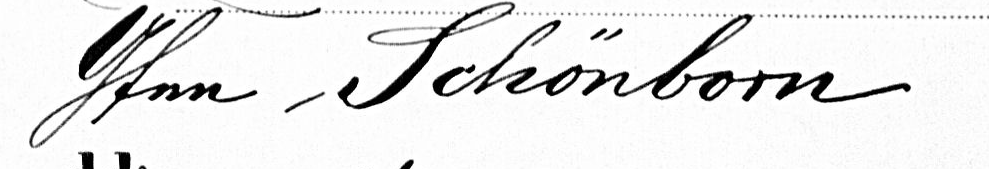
Gfen-Schönborn
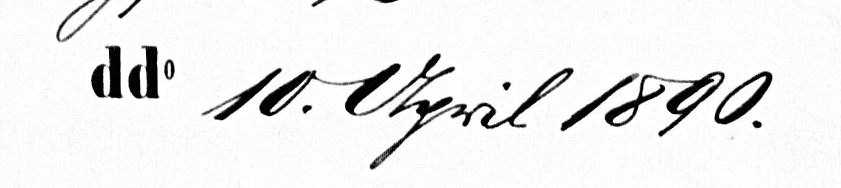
dd° 10. April 1890.
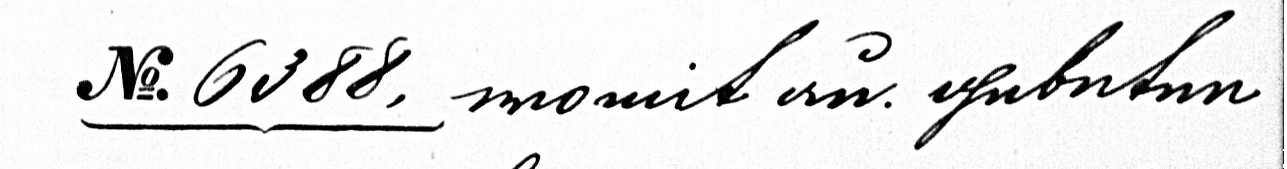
N° 6388, womit au. gebeten
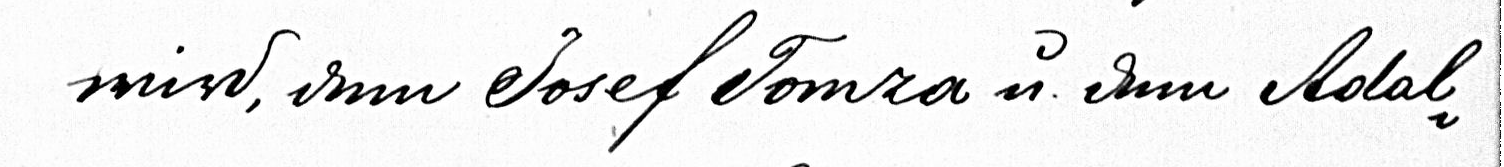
wird, dem Josef Tomza u. dem Adal¬
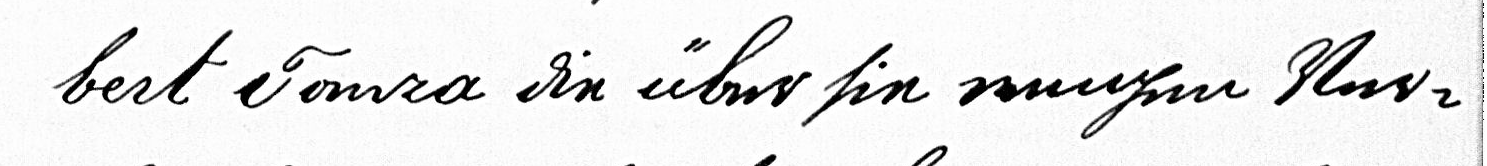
bert Tomza die über sie wegen Ver¬
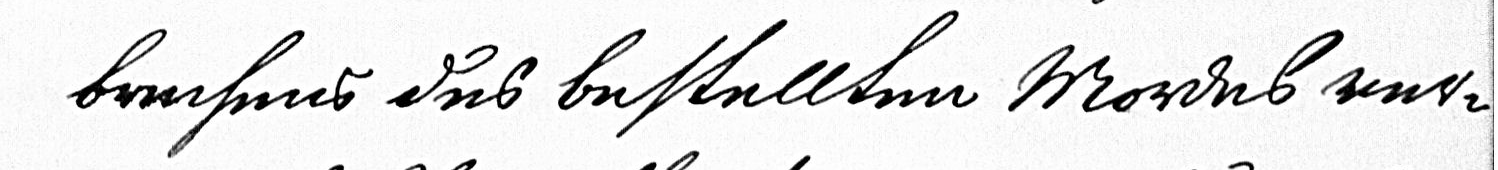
brechens des bestellten Mordes ver¬
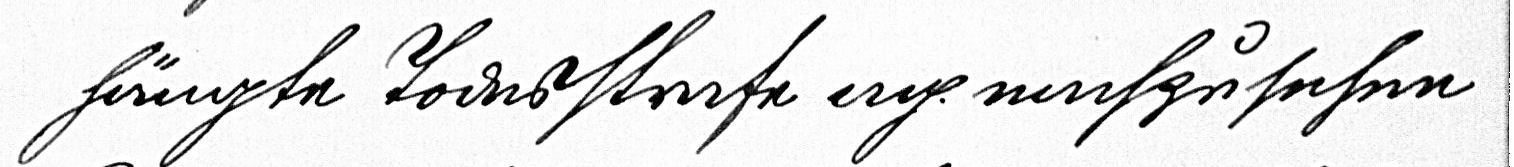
hängte Todesstrafe ag. nachzusehen und
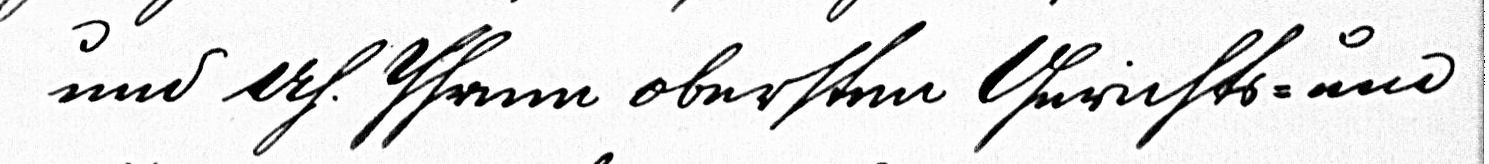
Ah. Ghann obersten Gerichts- und
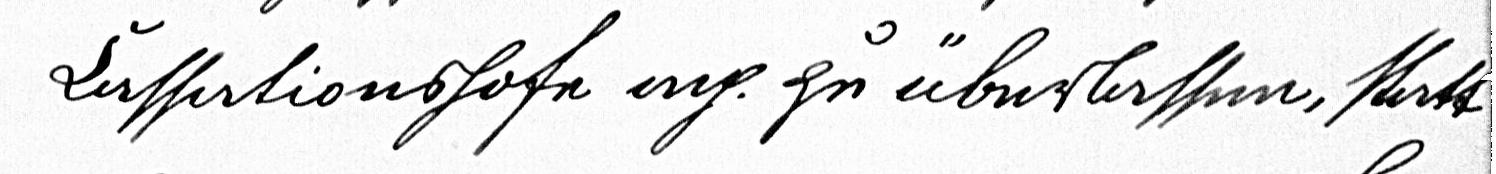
Cassationshofe ag. zu überlassen, statt
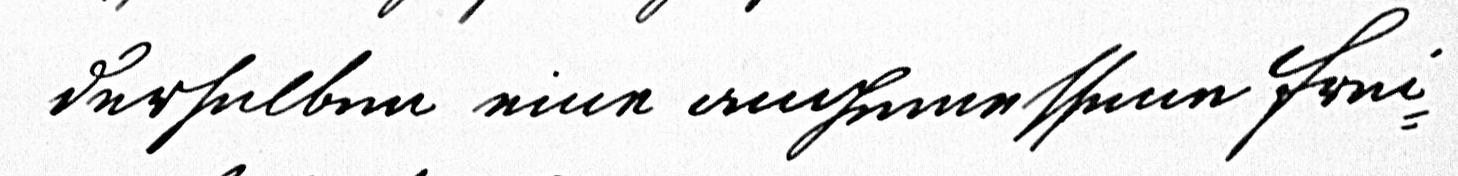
derselben eine angemessene Frei¬
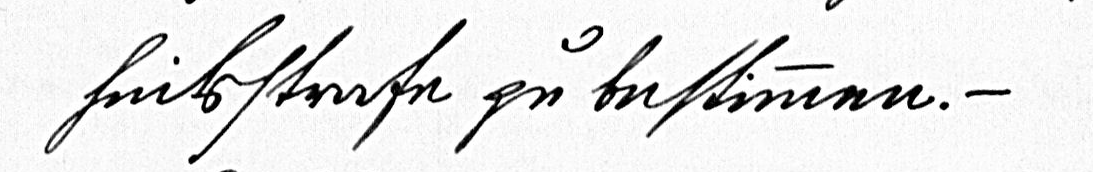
heitsstrafe zu bestimmen.-
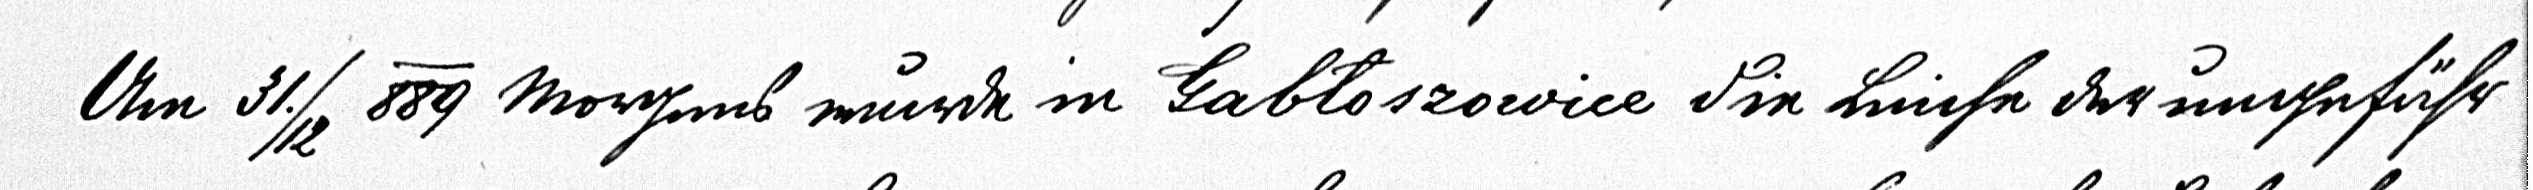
Am 31./12 889 Morgens wurde in Gabłoszowice die Leiche der ungefähr
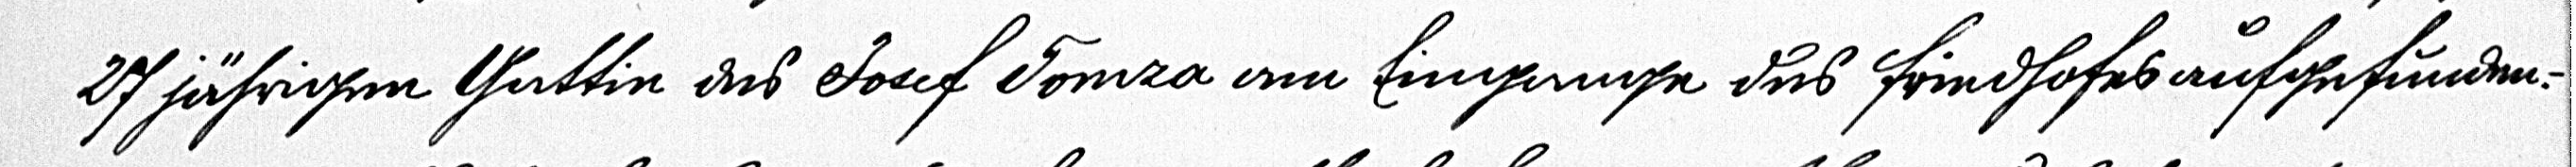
27 jährigen Gattin des Josef Tomza am Eingange des Friedhofes aufgefunden.-
